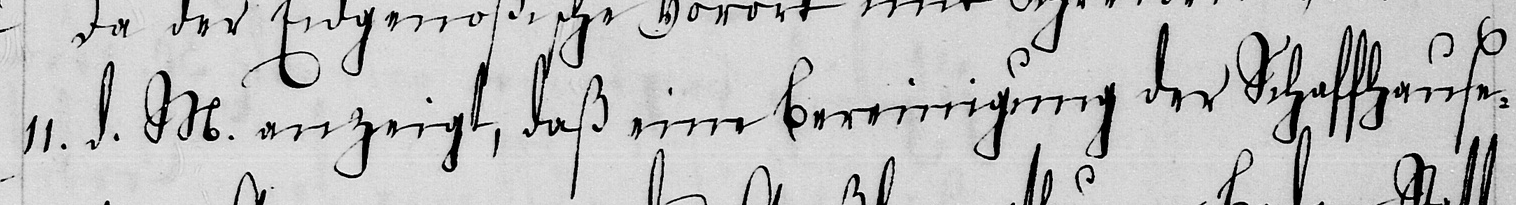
d. M. anzeigt, daß eine Bereinigung der Schaffhause¬
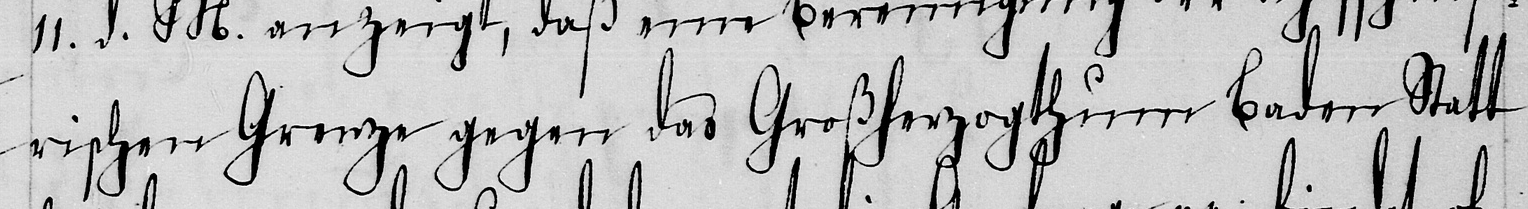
rischen Grenze gegen das Großherzogthum Baden Statt
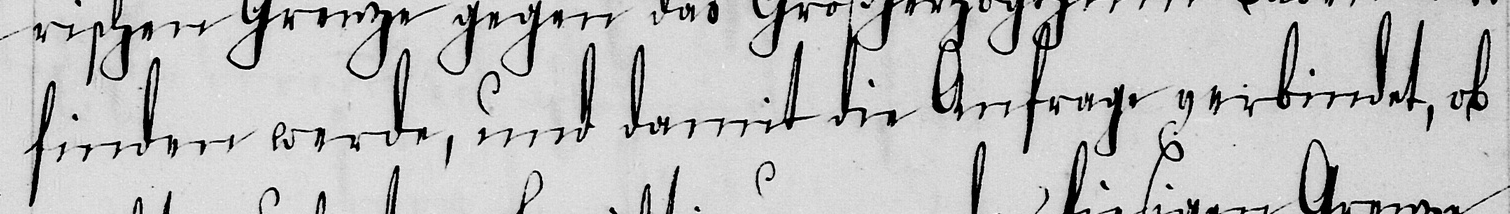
finden werde, und damit die Anfrage verbindet, ob
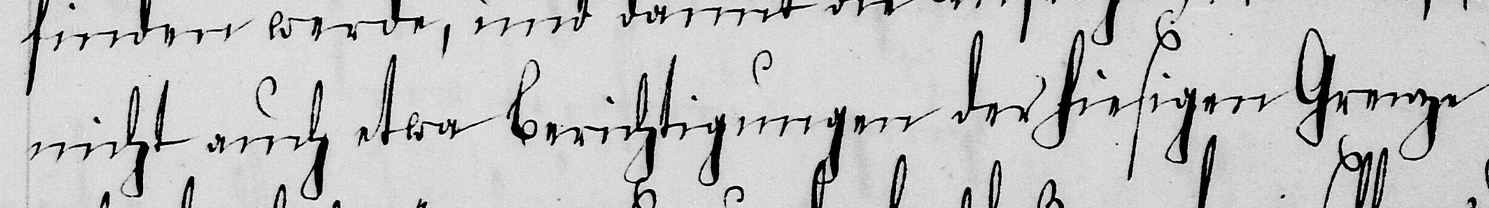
nicht auch etwa Berichtigungen der hiesigen Grenze
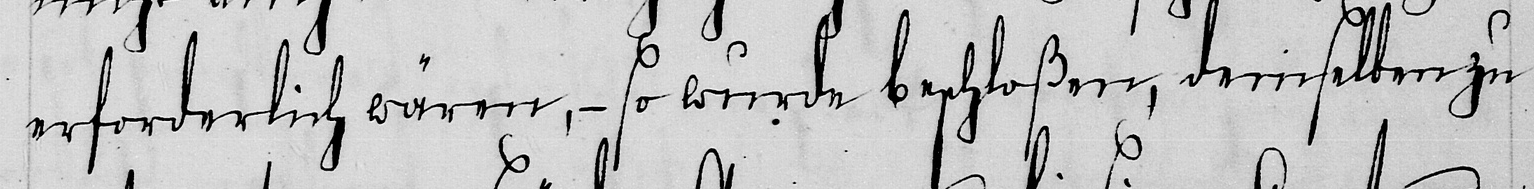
erforderlich wären, – so wurde beschloßen, demselben zu
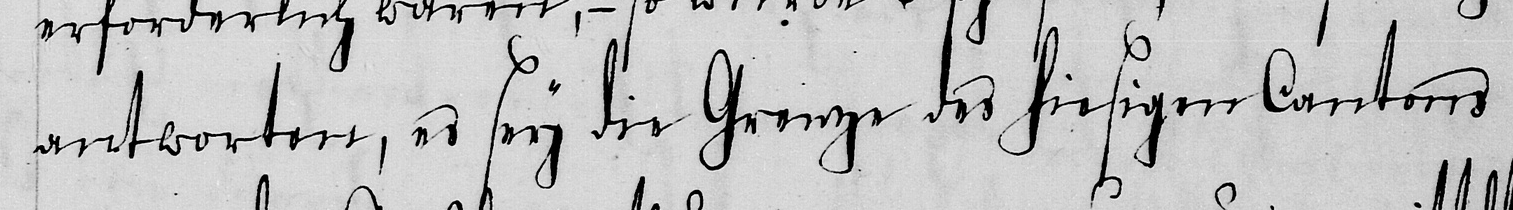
antworten, es sey die Grenze des hiesigen Cantons
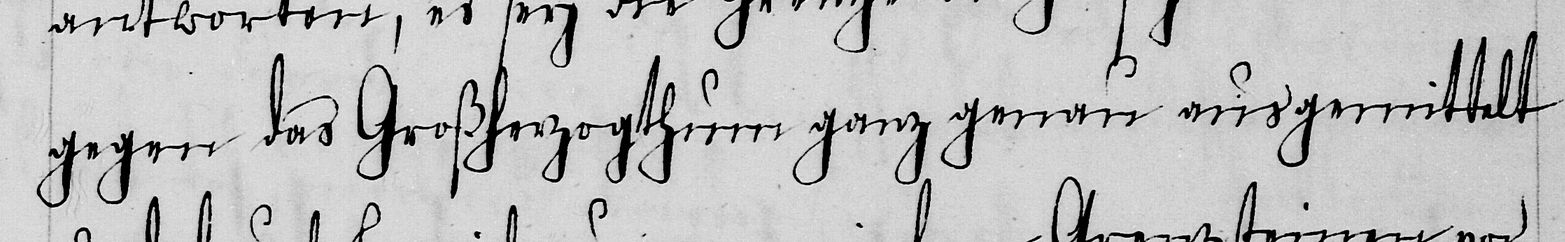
gegen das Großherzogthum ganz genau ausgemittelt
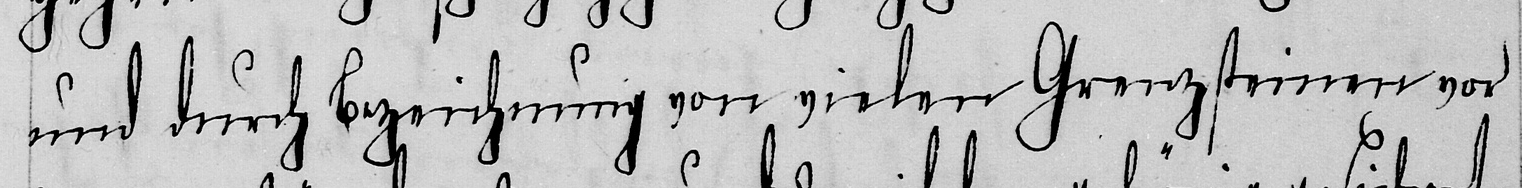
und durch Bezeichnung von vielen Grenzsteinen vor
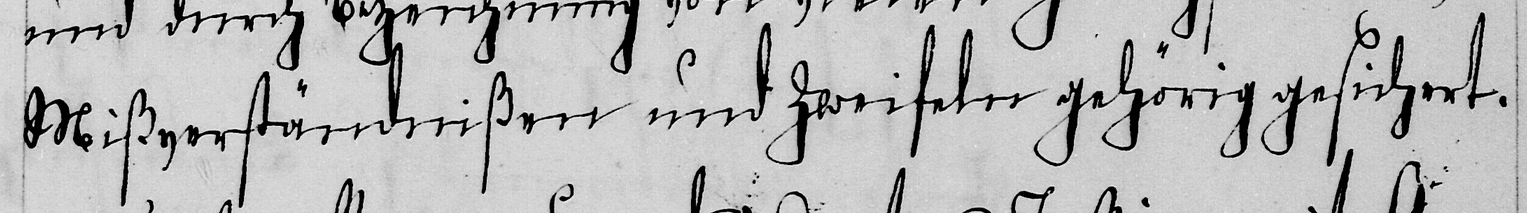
Mißverständnißen und Zweifeln gehörig gesichert.
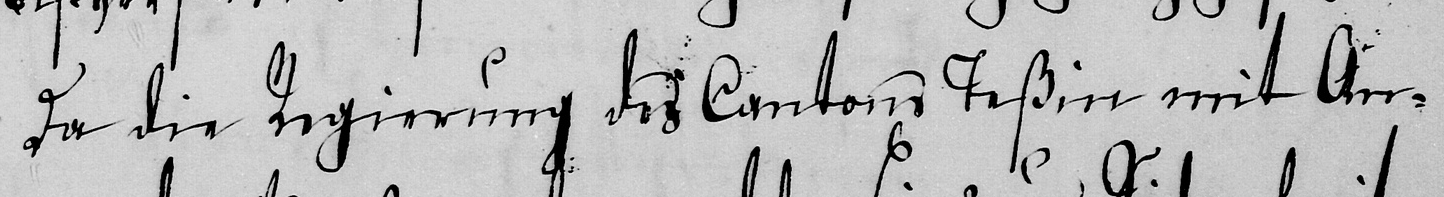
Da die Regierung des Cantons Teßin mit An¬
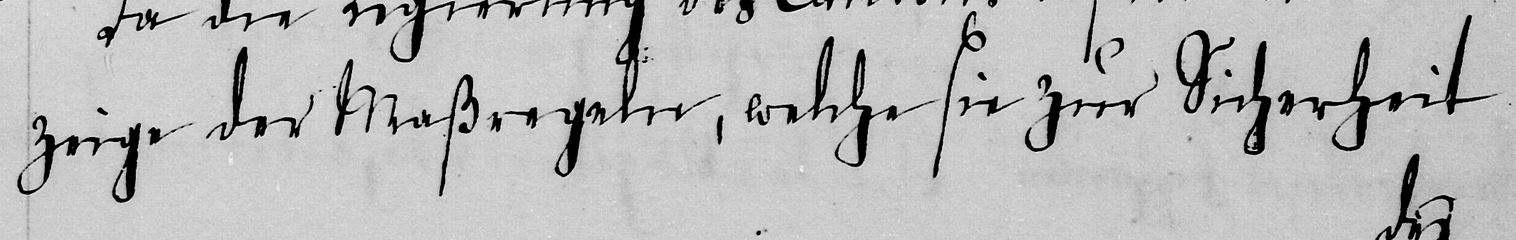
zeige der Maßregeln, welche sie zur Sicherheit
